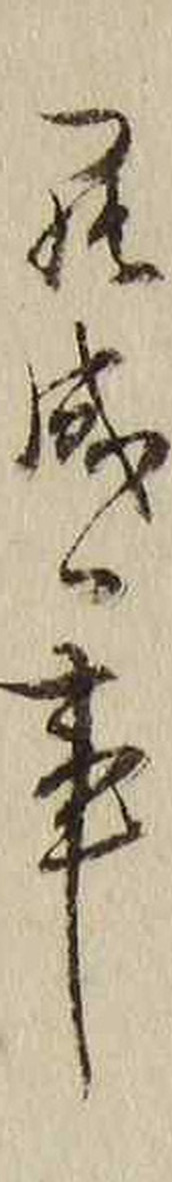羅成候事
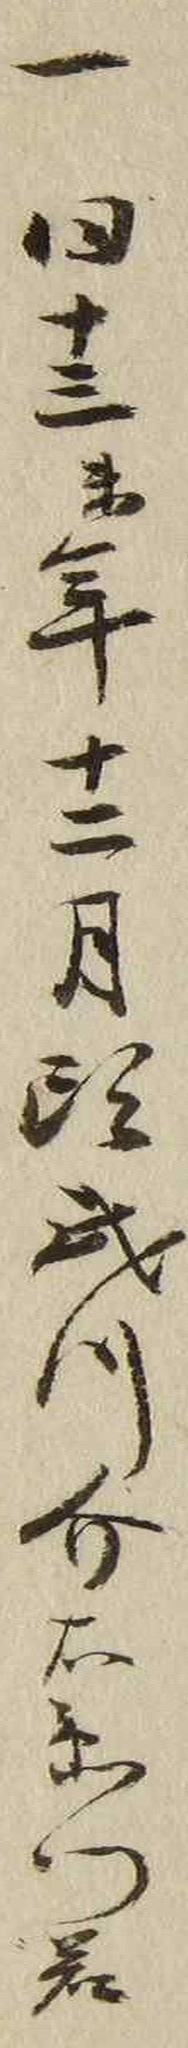一同十三未年十二月頭氏川介右衛門若
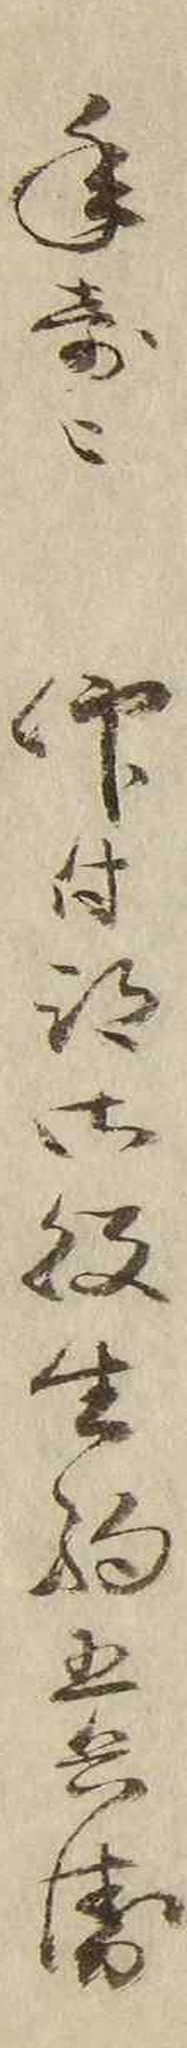年寄被仰付跡御役生駒五兵衛

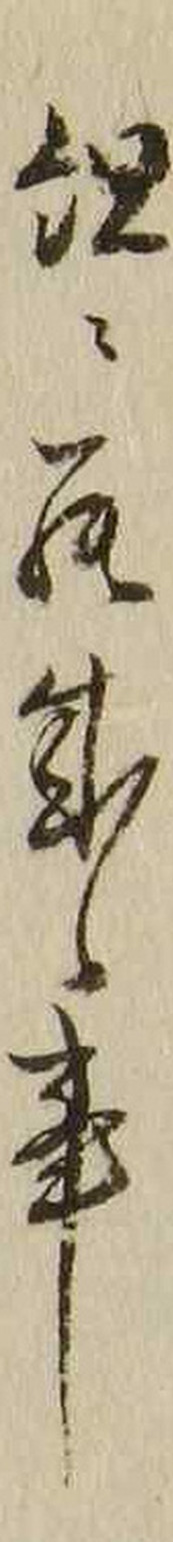組ニ罷成候事
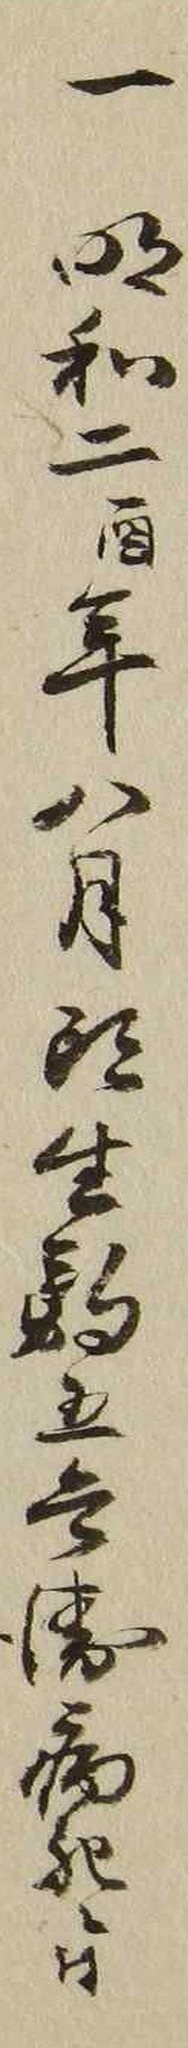一明和二酉年八月頭生駒五兵衛病死ニ付
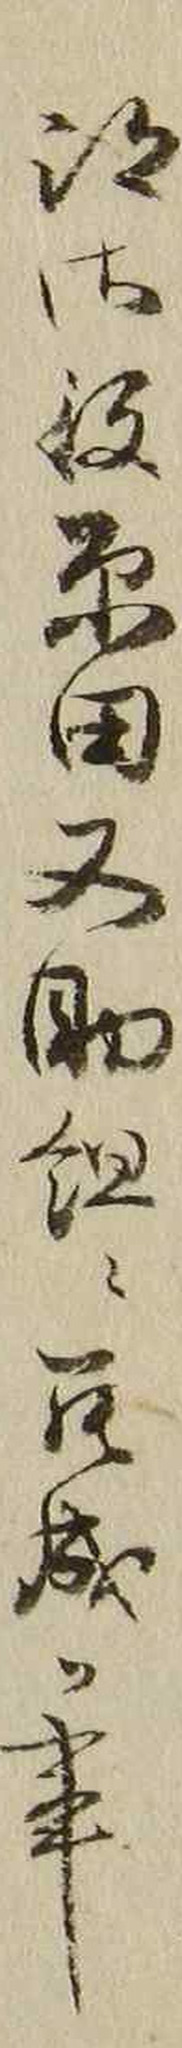跡御役原田又助組ニ罷成候事
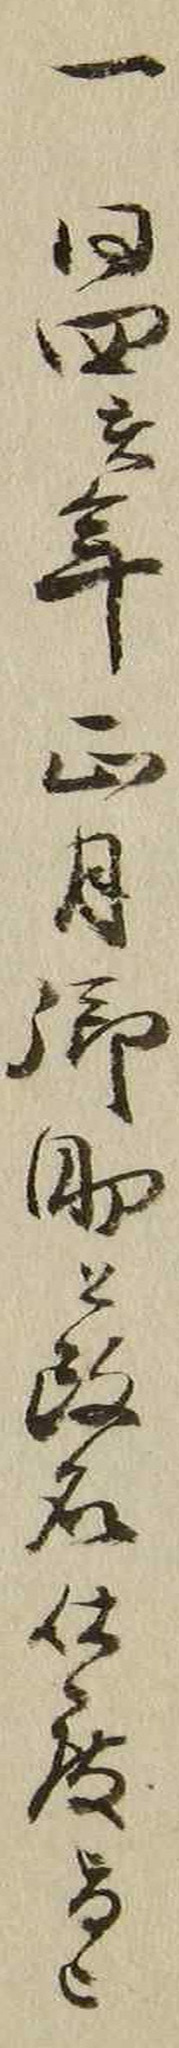一同四亥年正月郷助と改名仕度旨被
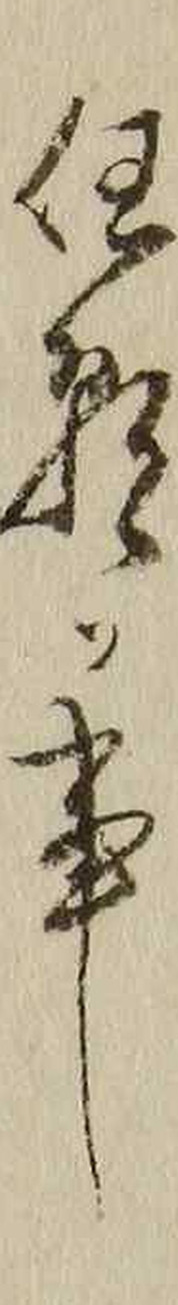任願候事
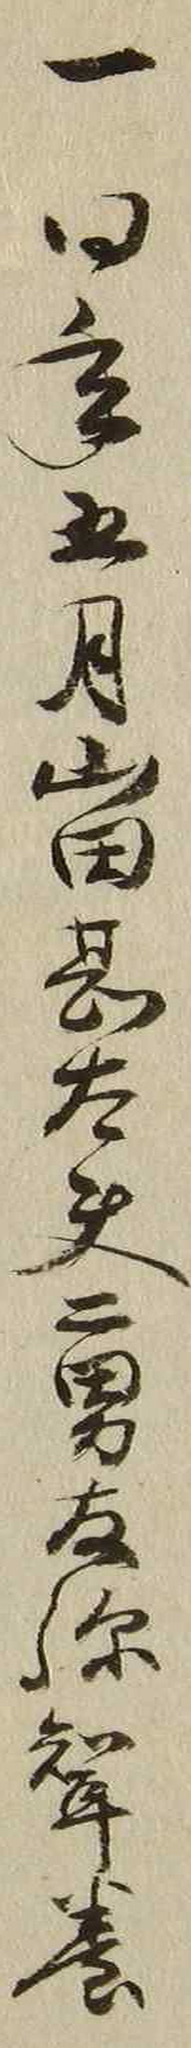一同年五月山田甚太夫二男友弥婿養
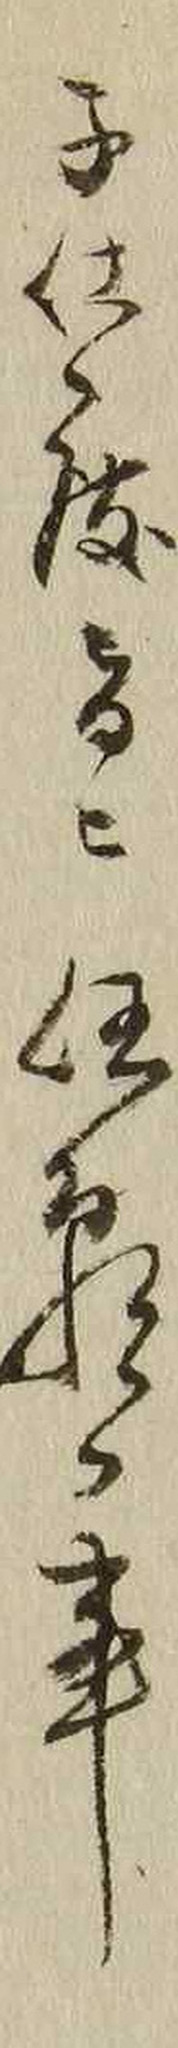子仕度旨被任願候事
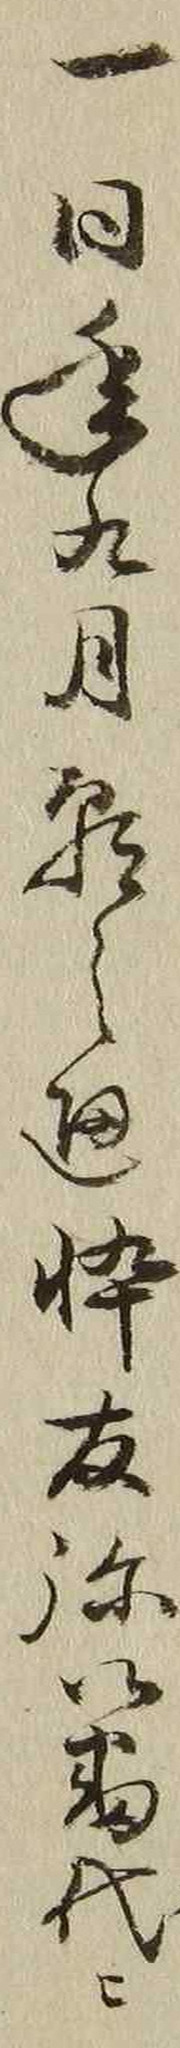一同年九月願之通忰友弥御番代被
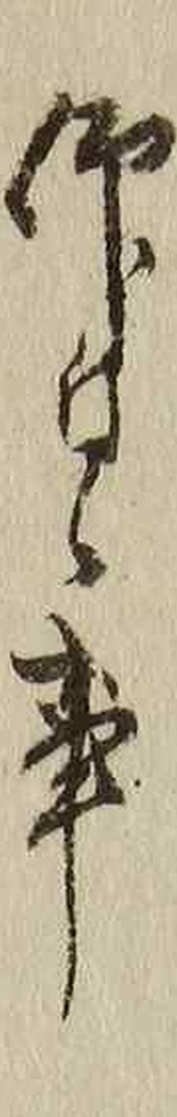仰付候事
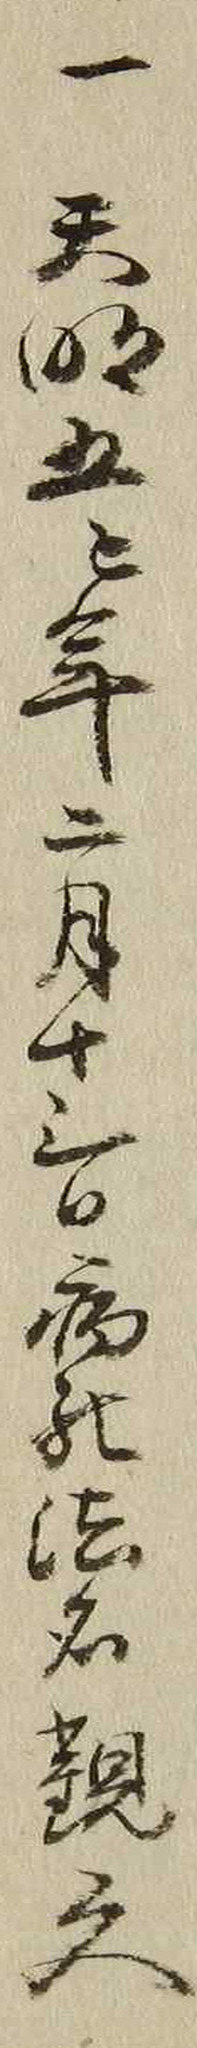一天明五巳年二月十三日病死法名観久
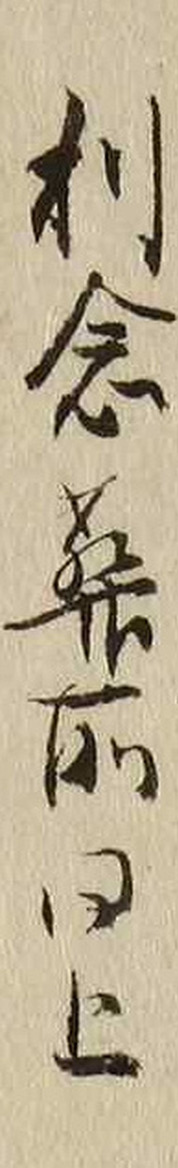利念葬所同上
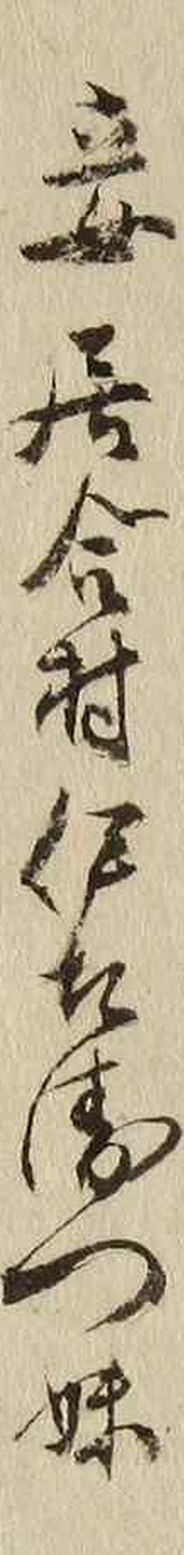妾居合村伊左衛門妹
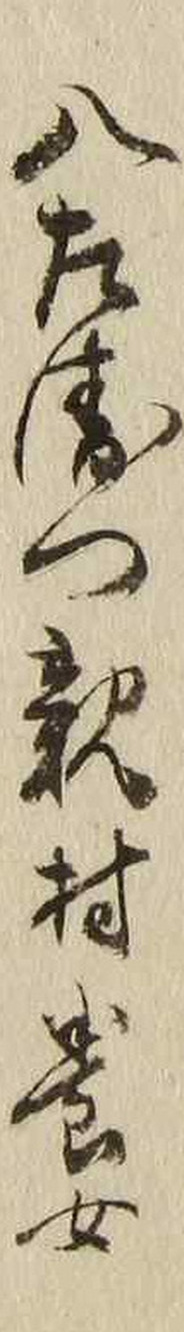女八左衛門親村養女
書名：諸士系譜　巻之232　け之部1
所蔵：会津若松市立会津図書館
